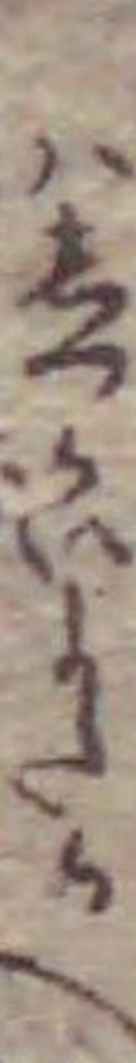はしつかいよたかの
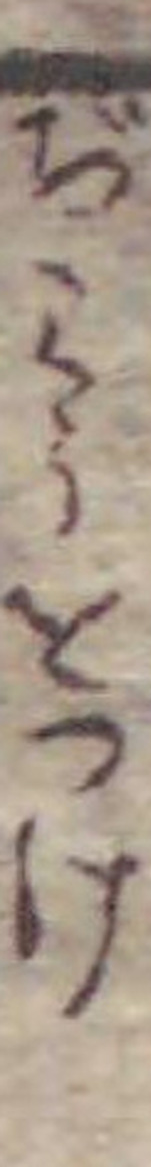ぢわうをつけ
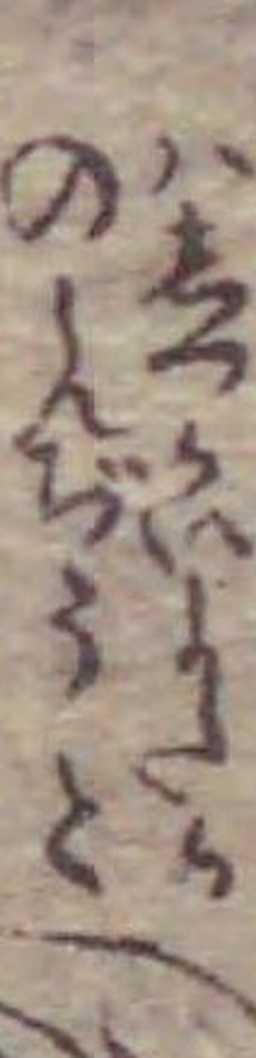しんぢうと
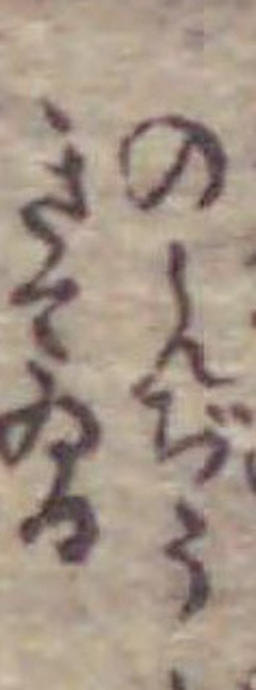きてゐる
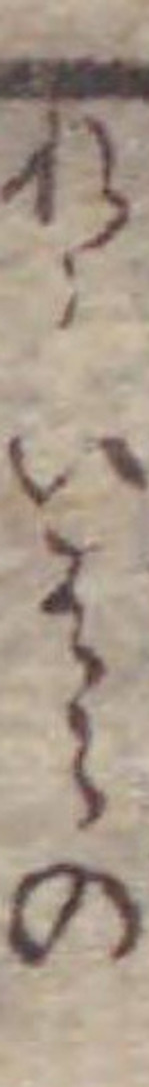ねらいはらの
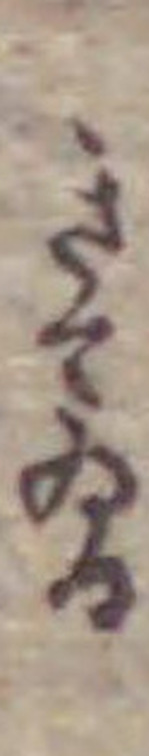きてゐる
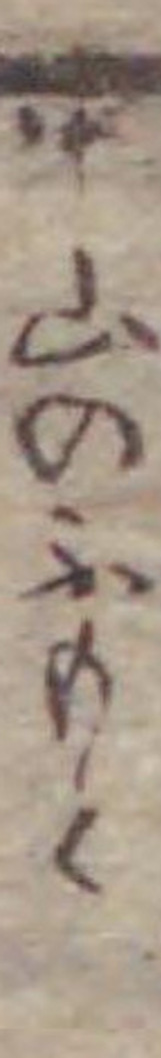中山のふもと
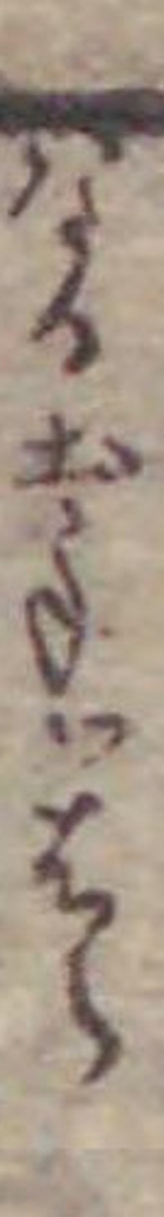なる土手っはら
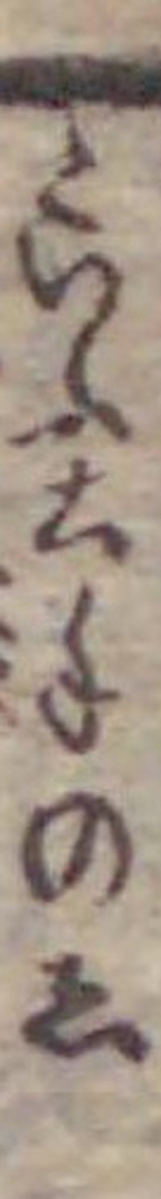といふ土手のし
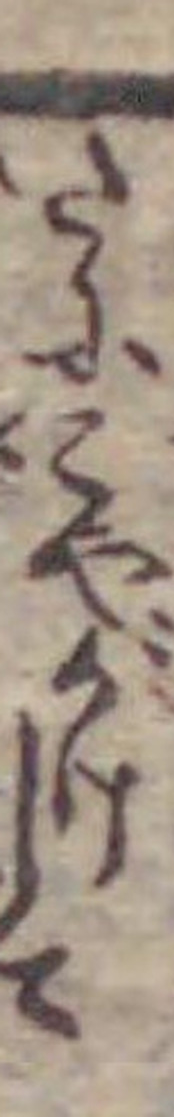たにこやがけして
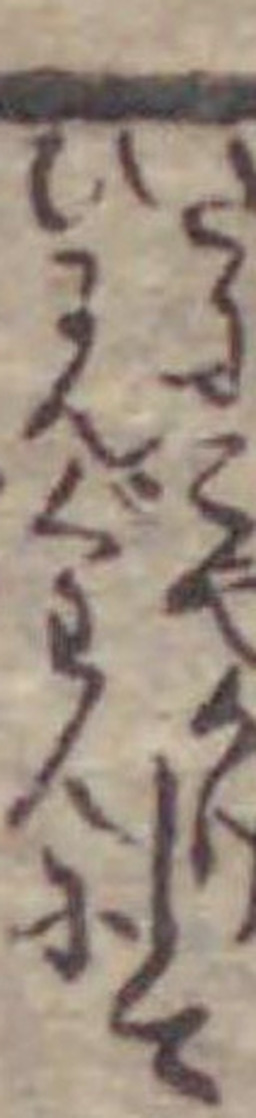ひにんぐわんに
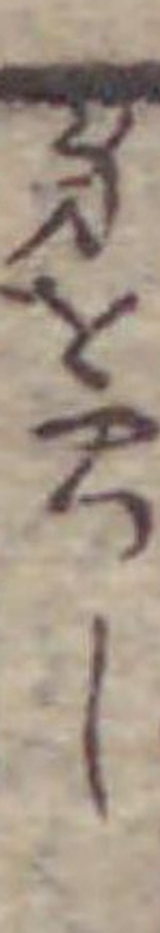身をやつし
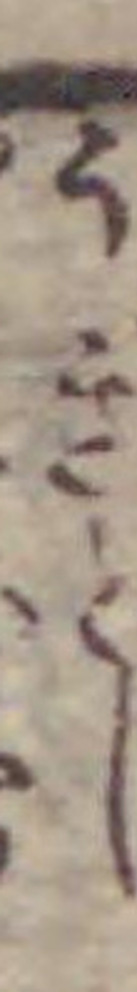うきとし
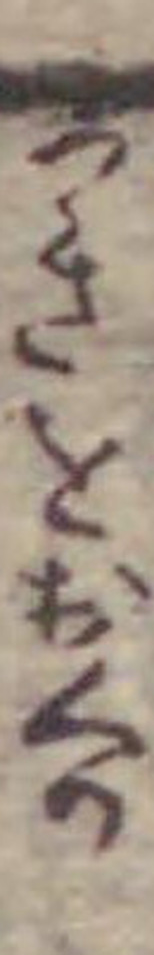つきをおくり
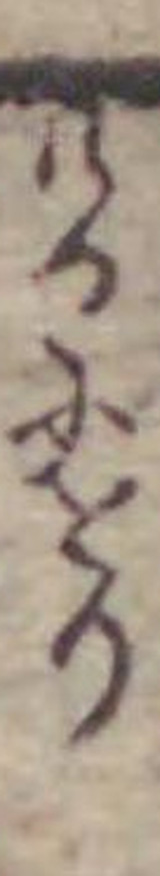けるにをり
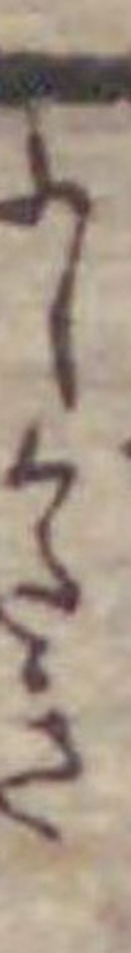ふしかたき
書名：鼻下長生薬 : 3巻
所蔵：国立国会図書館 National Diet Library, JAPAN
